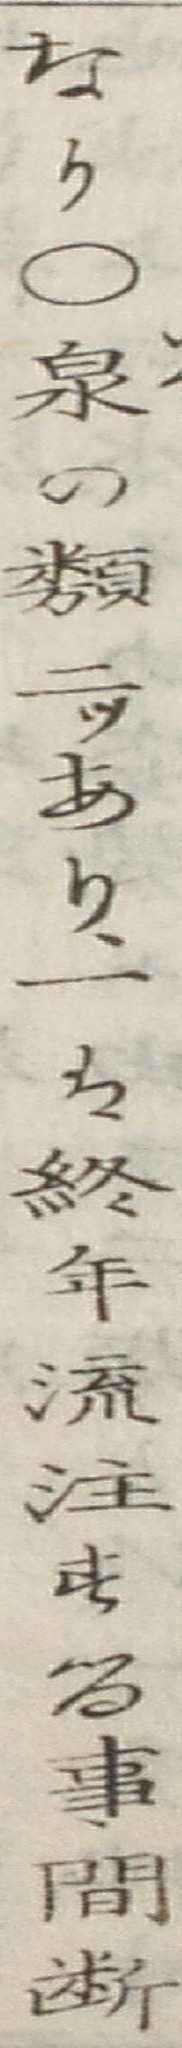なり○泉の類二ツあり、一は終年流注する事間断
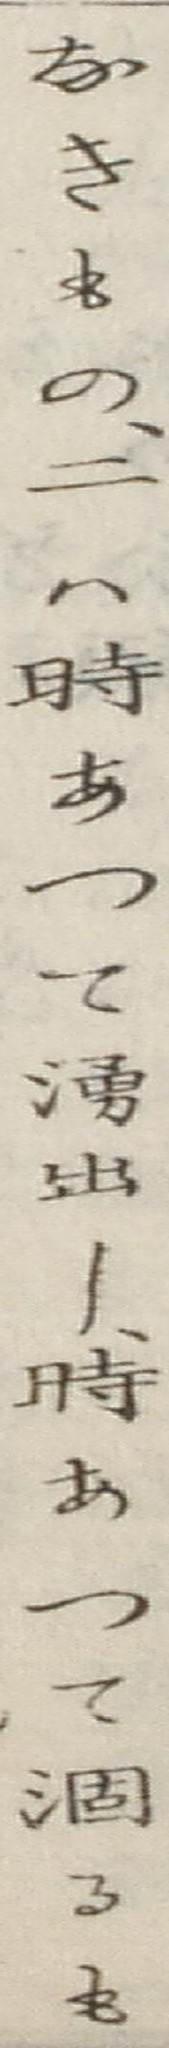なきもの、二は時あつて湧出し、時あつて涸るも
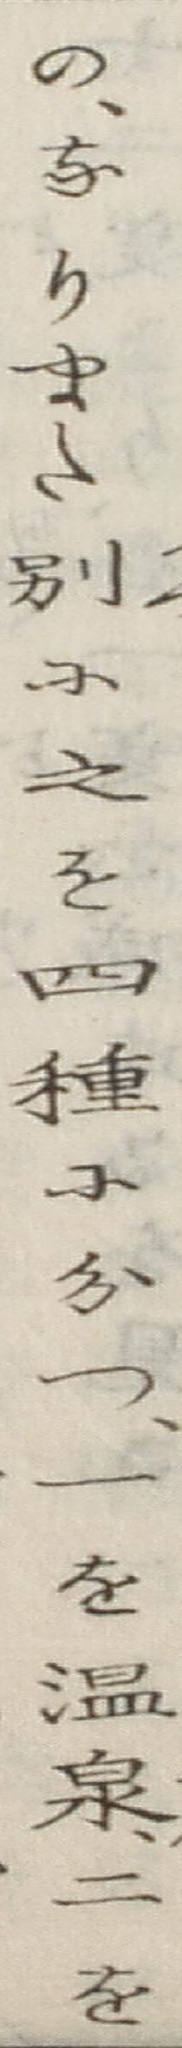の、なりまた別に之を四種に分つ、一を温泉、二を
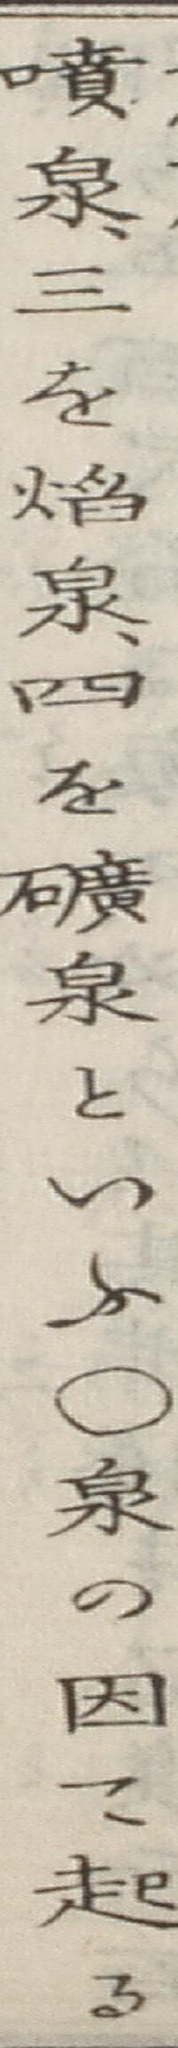噴泉、三を焔泉、四を礦泉といふ○泉の因て起る
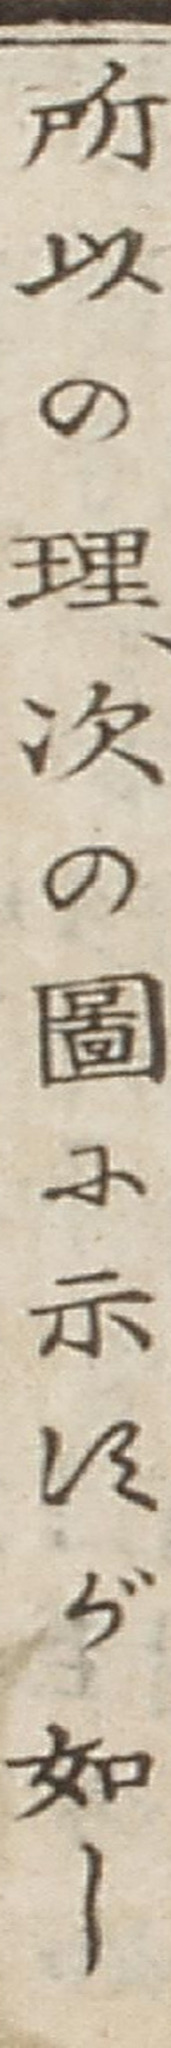所以の理、次の図に示すが如し
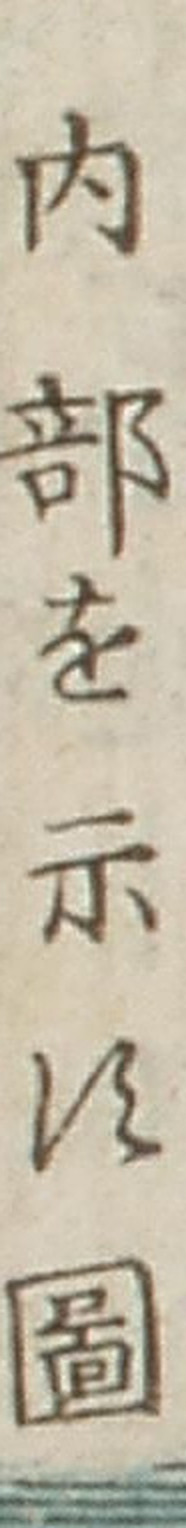内部を示す図

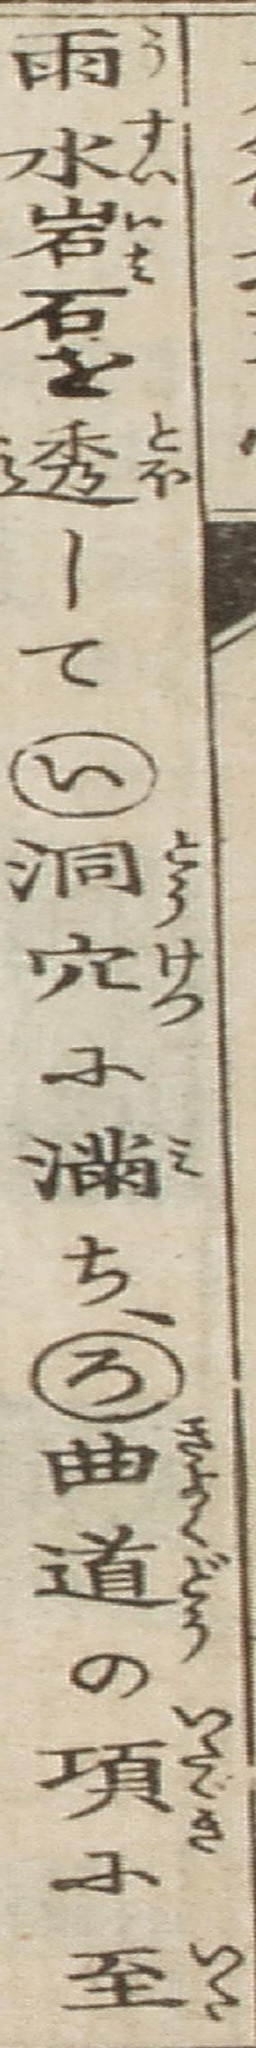雨水岩石を透して洞穴に満ち、曲道の頂に至
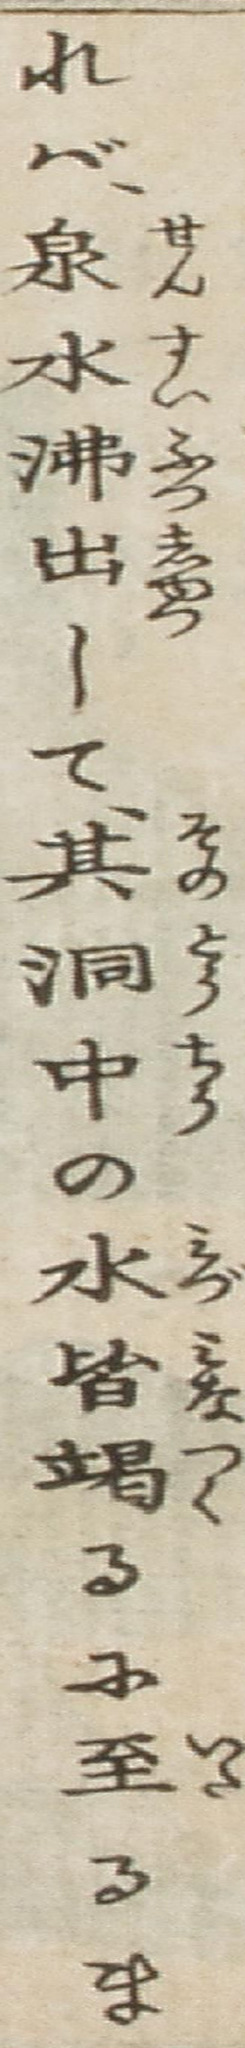れば、泉水沸出して、其洞中の水皆竭るに至るま
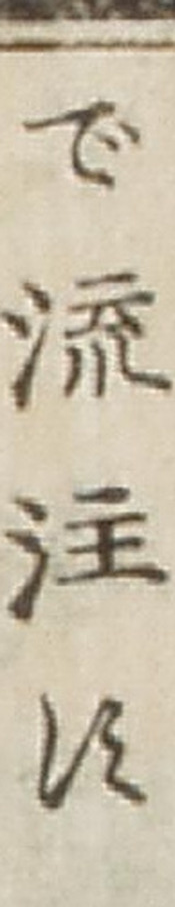で流注す
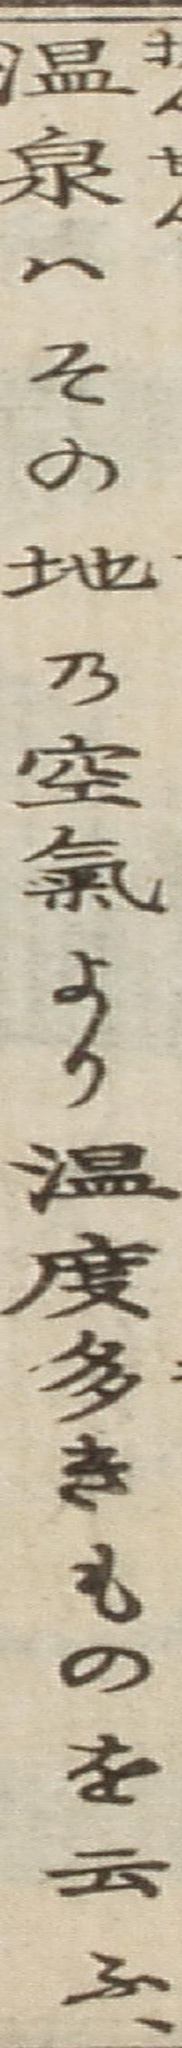温泉はその地の空気より温度多きものを云ふ、
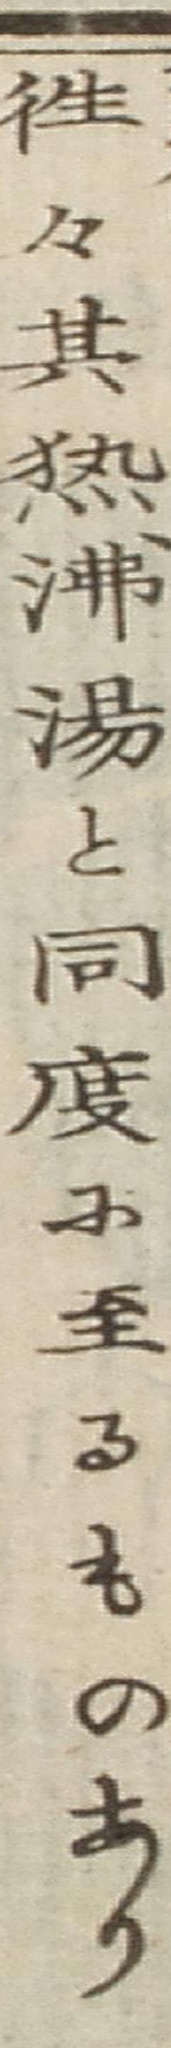往々其熱沸湯と同度に至るものあり
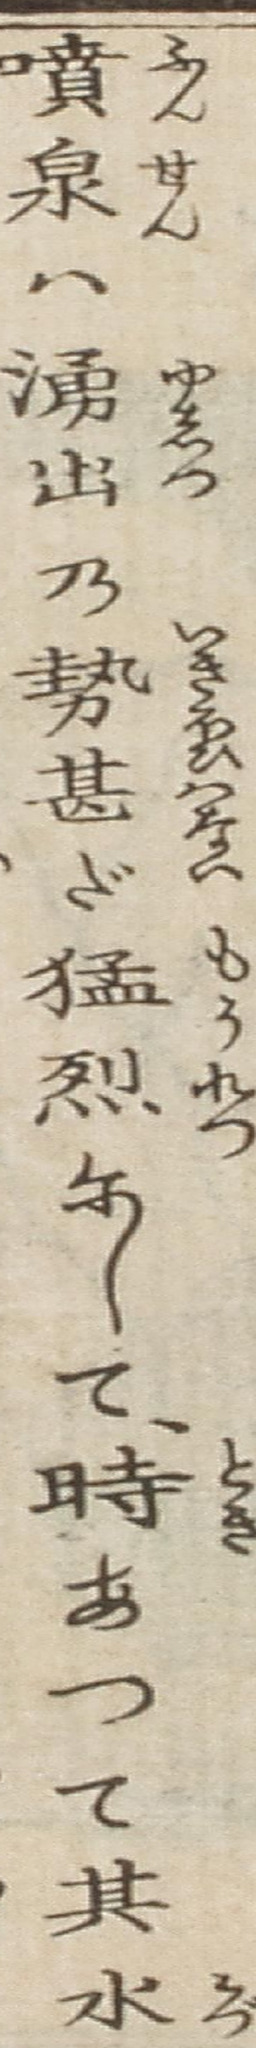噴泉は湧出の勢甚だ猛烈にして、時あつて其水
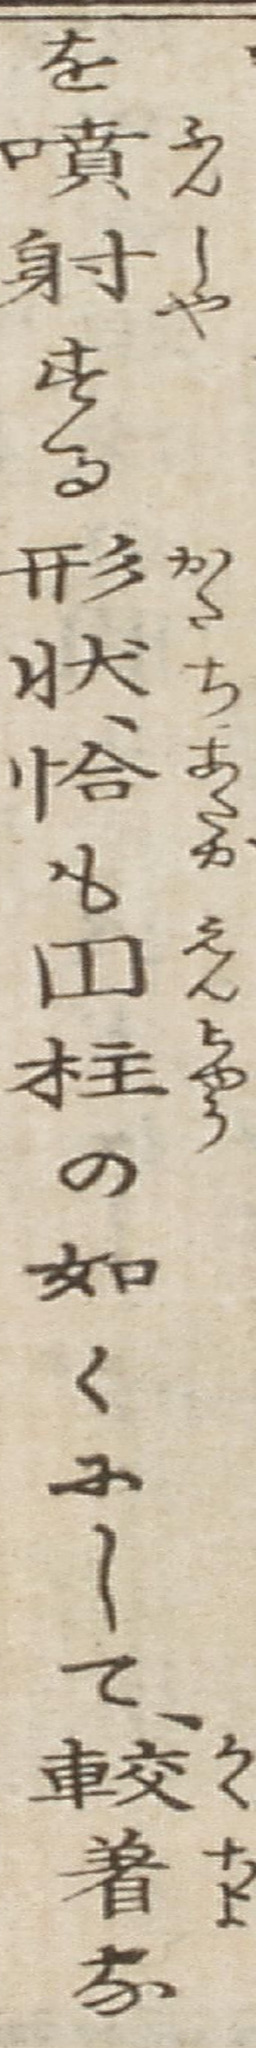を噴射する形状恰も円柱の如くにして、較着な
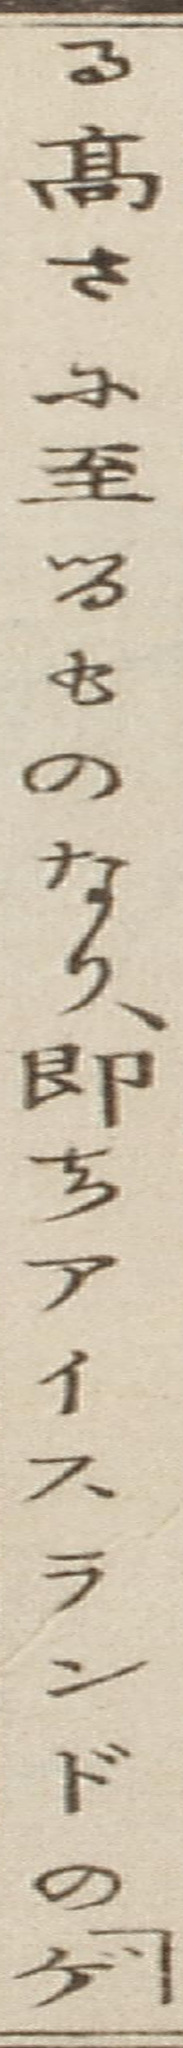る高さに至るものなり、即ちアイスランドの「ゲ
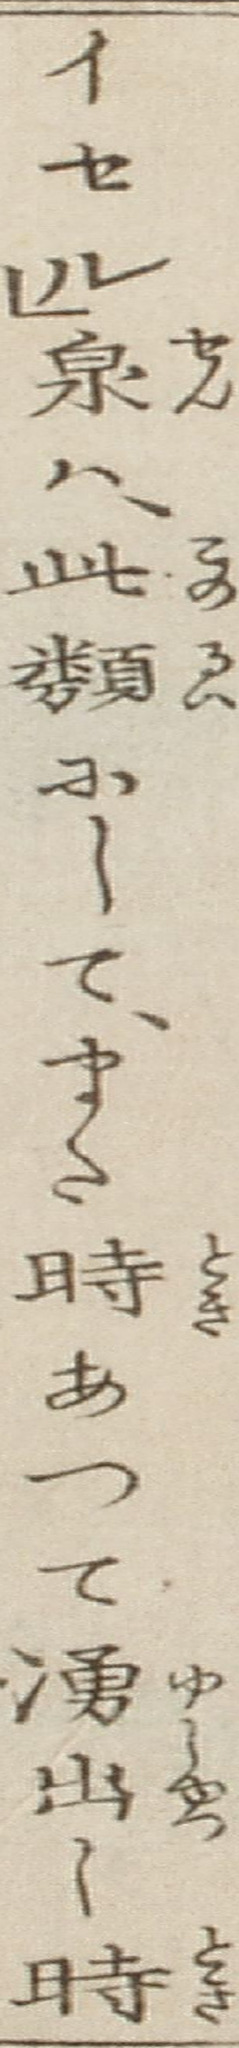イセル」泉は、此類にして、また時あつて湧出し時
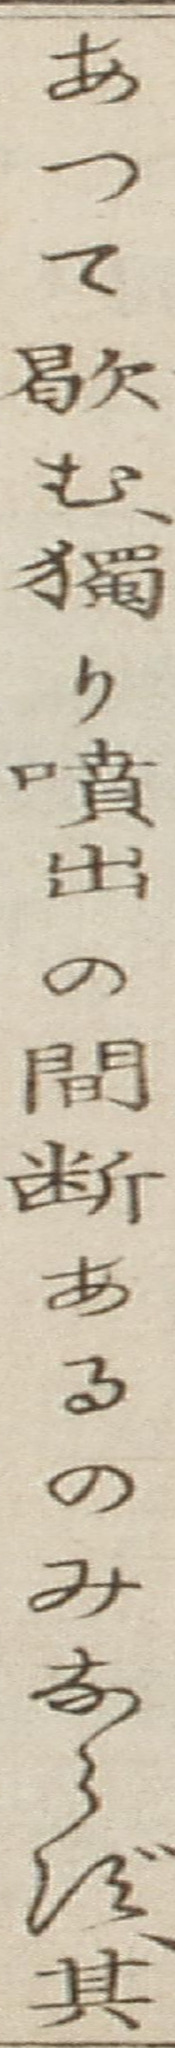あつて歇む、独り噴出の間断あるのみならず、其
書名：訓蒙　天然地理學　中
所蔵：東京大学地震研究所図書室 Earthquake Research Institute Library, The University of Tokyo, JAPAN
